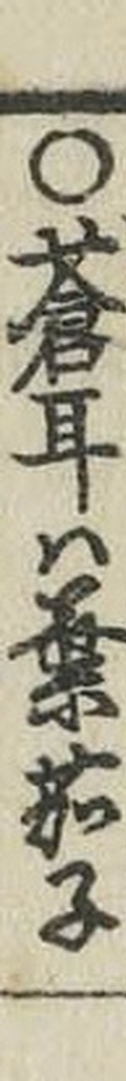○蒼耳は葉茄子
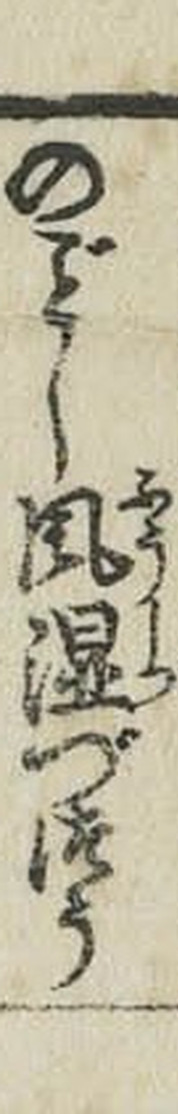のごとし風湿づつう
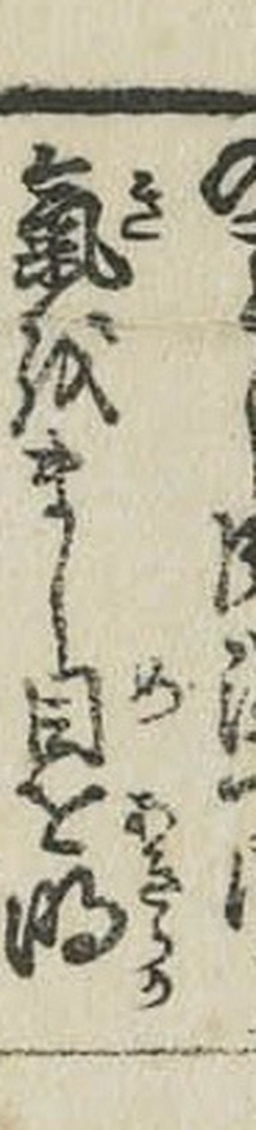気をまし目を明
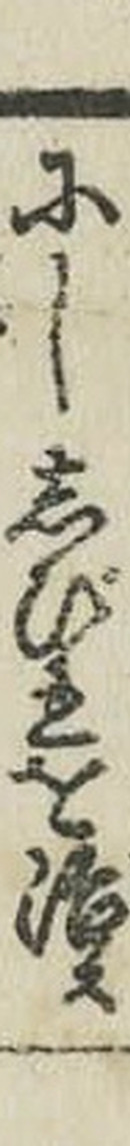にししびれを治す
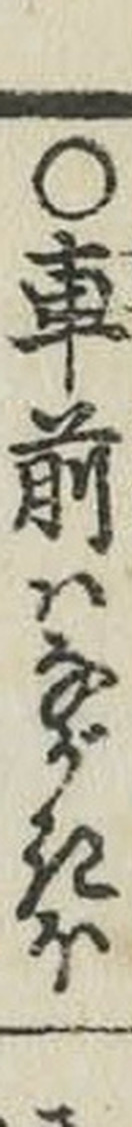○車前はながきほ
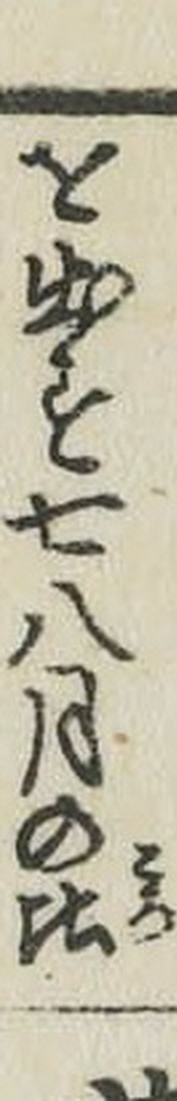を出す七八月の比
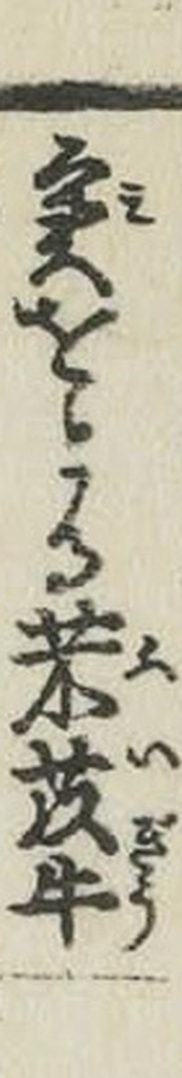実をとる芣苡牛
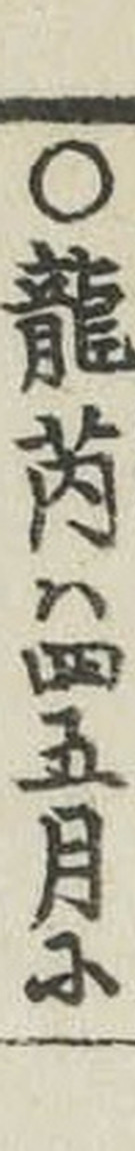○龍芮は四五月に
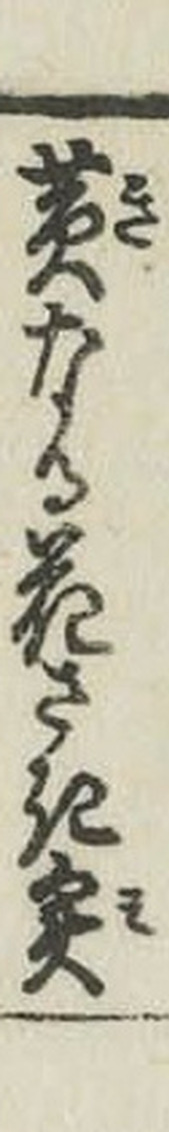黄なる花さき実
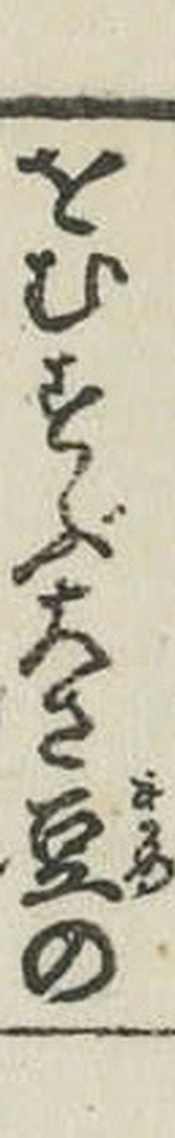をむすぶ大さ豆の
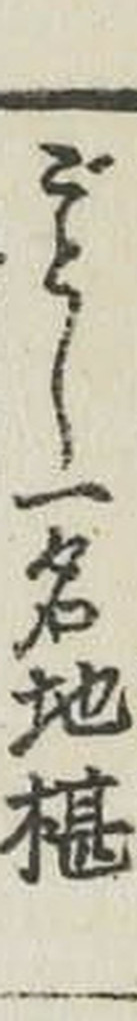ごとし一名地椹
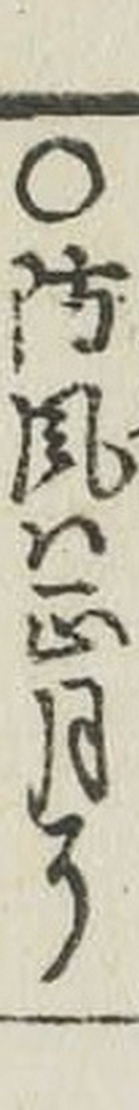○防風は正月に
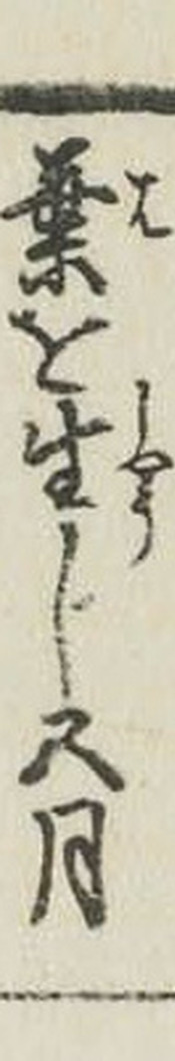葉を生じ五月
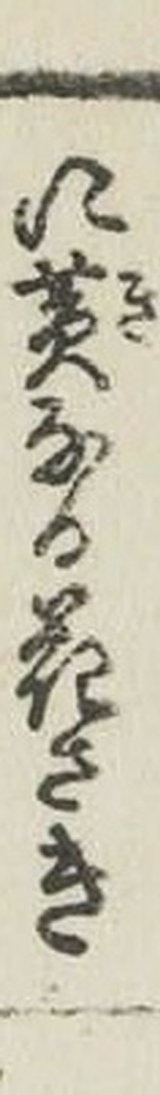に黄なる花さき
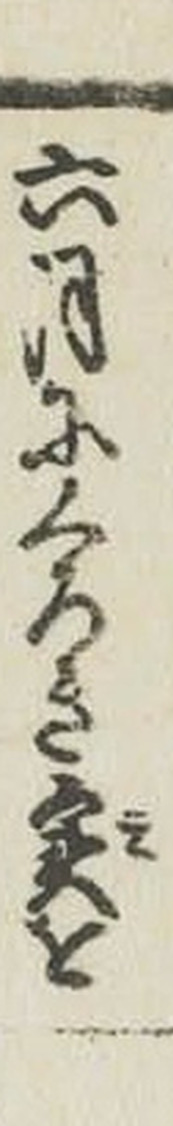六月にくろき実を
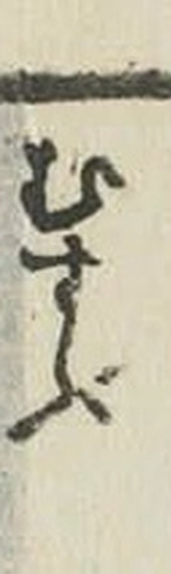むすぶ
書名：増補頭書訓蒙図彙大成 10巻 9:巻之20
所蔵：東京学芸大学教育コンテンツアーカイブ
